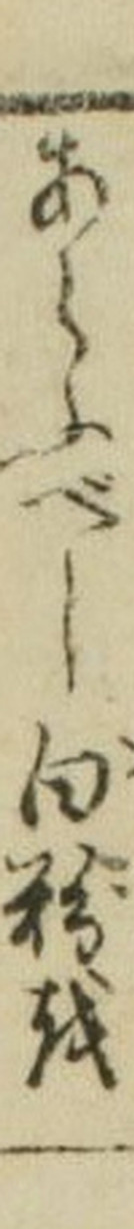あらふべし白粉を
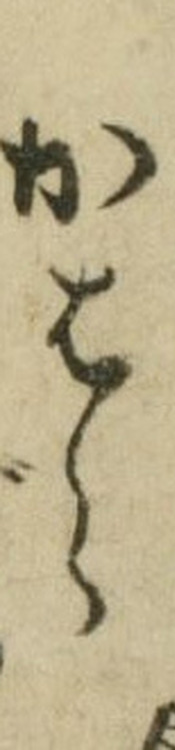かはら
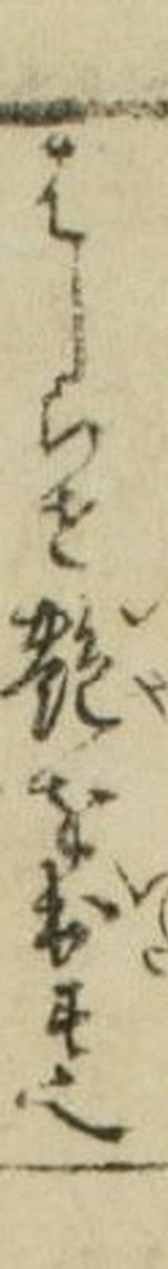はしらせ艶を出す也
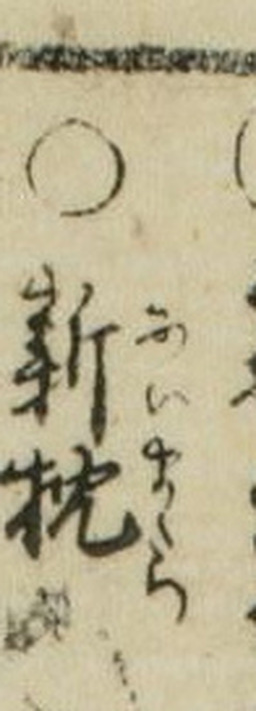○新枕
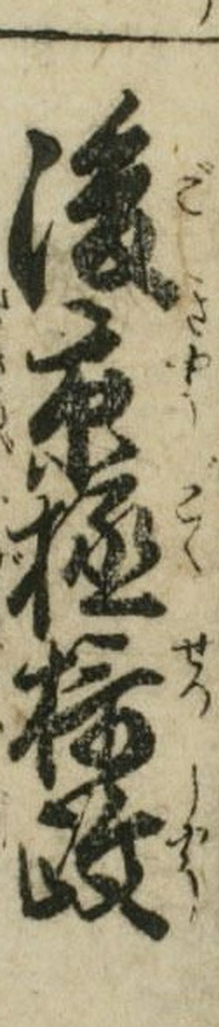後京極摂政
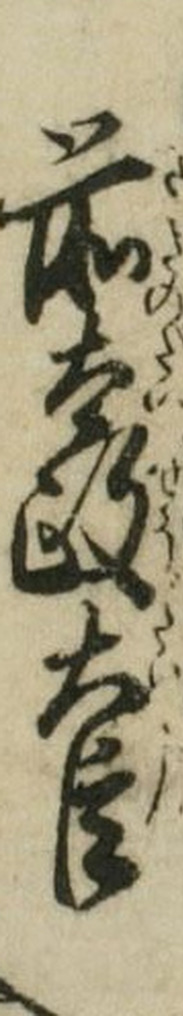前太政大臣
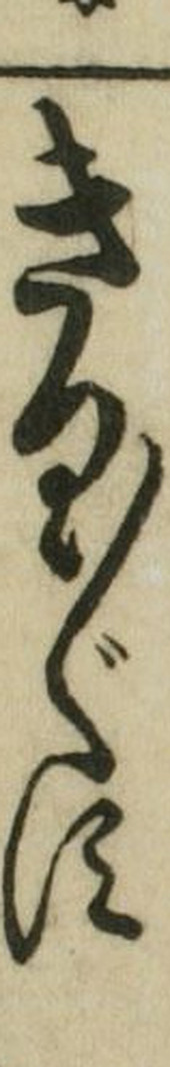きり〴〵す
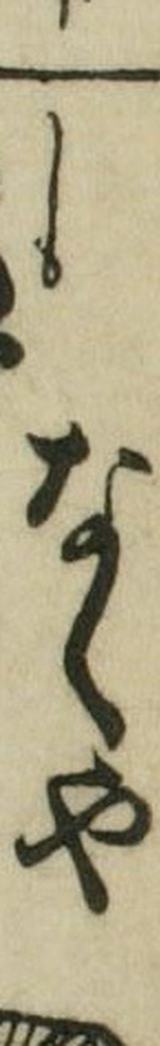なくや
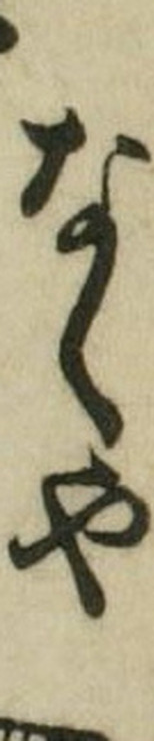なくや
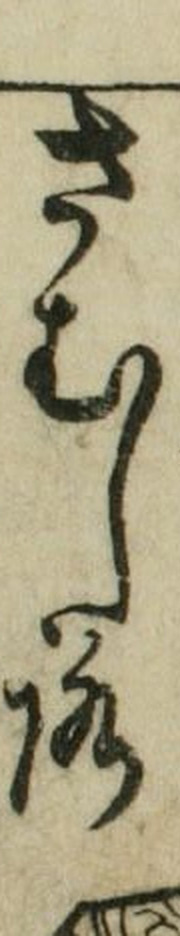さむしろ
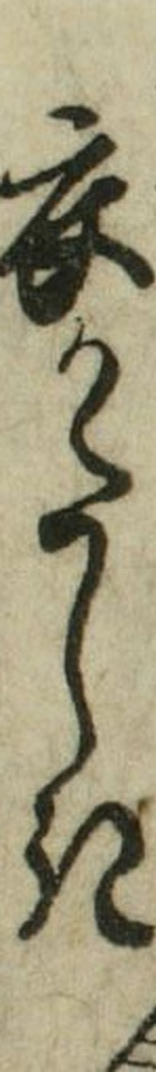衣かたしき
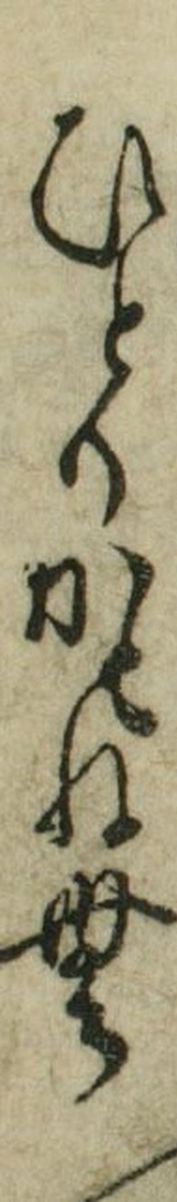ひとりかもねむ

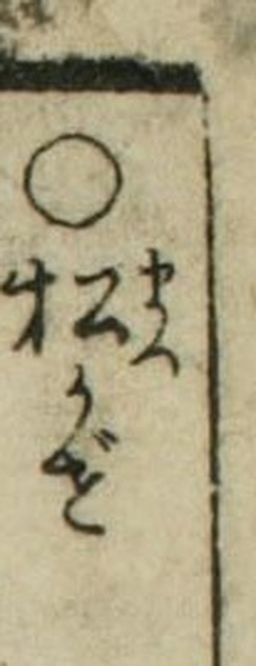○松かぜ
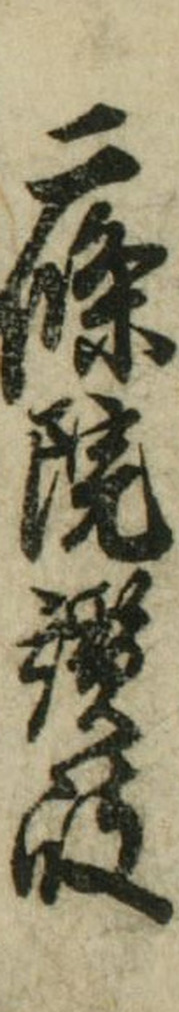二条院讃岐
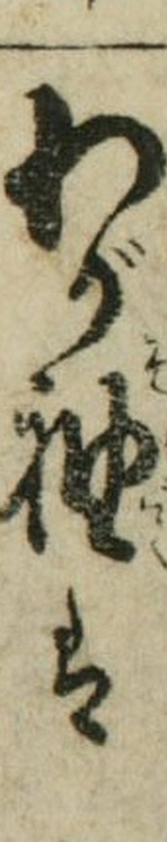わが袖は
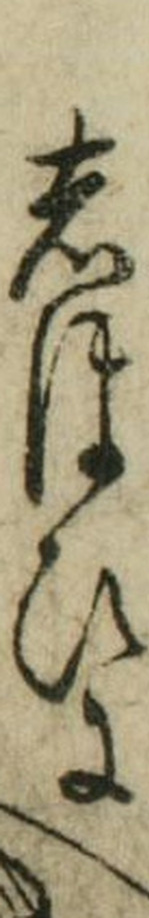しほひに
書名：百人一首
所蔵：東京学芸大学教育コンテンツアーカイブ
